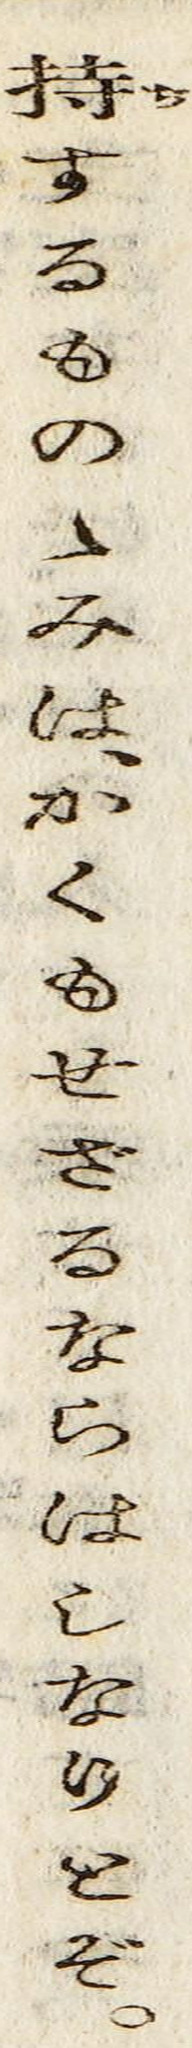持するものゝみは、かくもせざるならはしなりとぞ。
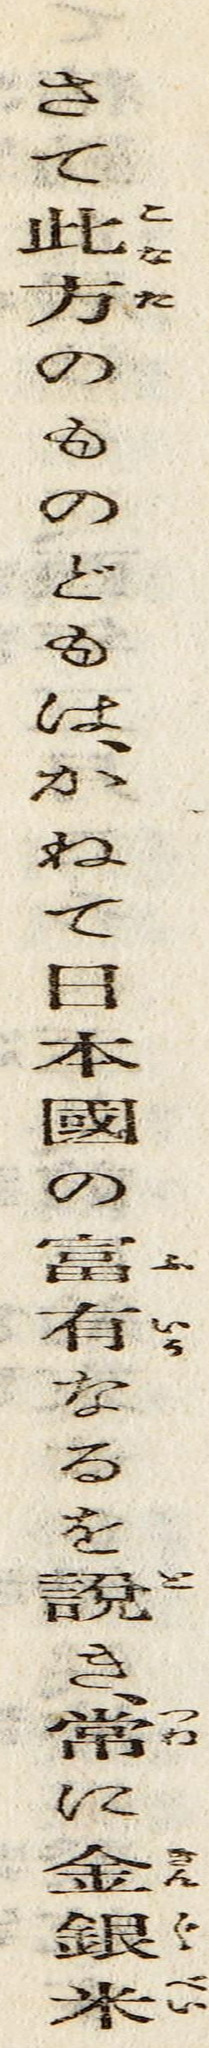さて此方のものどもは、かねて日本国の富有なるを説き、常に金銀米
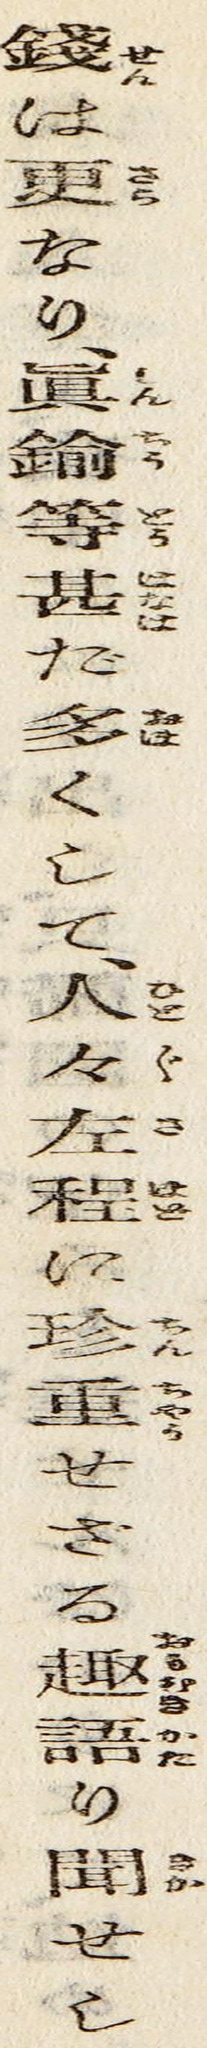銭は更なり、真鍮等甚だ多くして、人々左程に珍重せざる趣語り聞せし
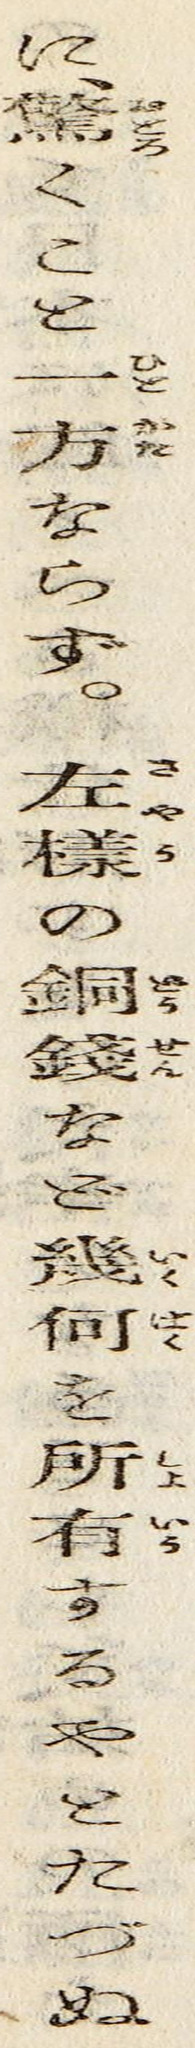に、驚くこと一方ならず。左様の銅銭など幾何を所有するやとたづぬ
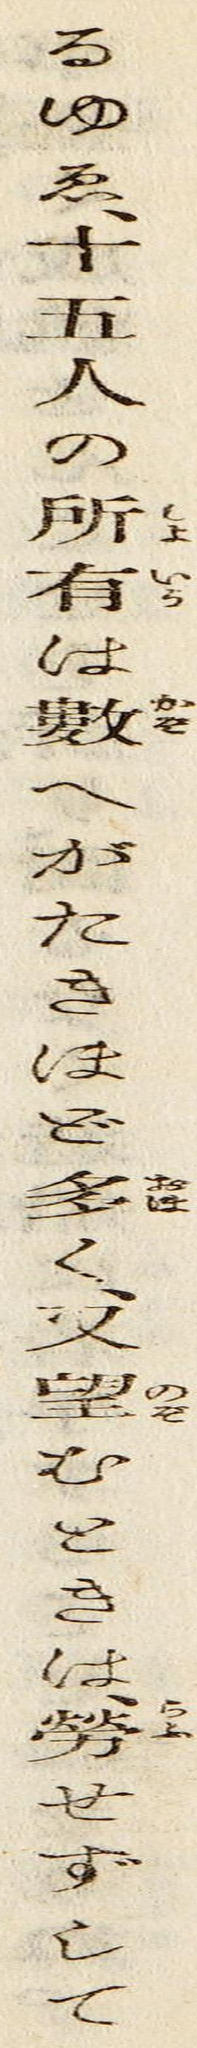るゆゑ、十五人の所有は数へがたきほど多く、又望むときは、労せずして
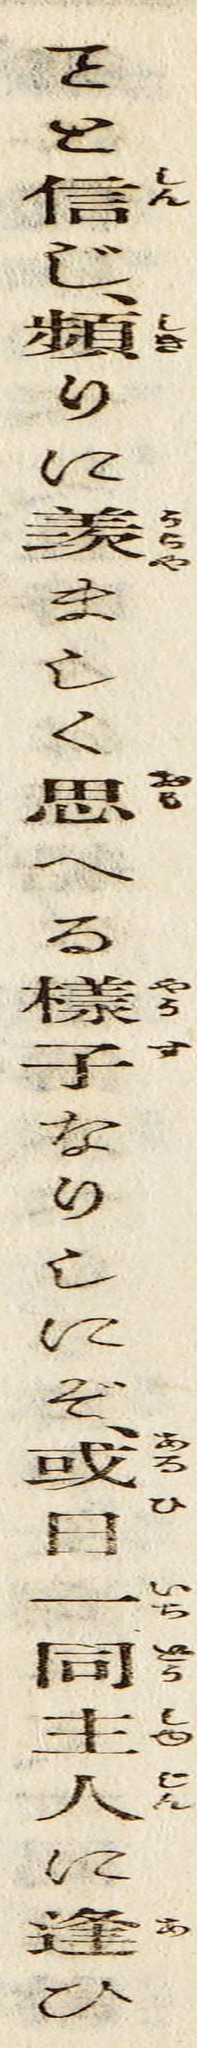ことと信じ、頻りに羨ましく思へる様子なりしにぞ、或日一同主人に逢ひ
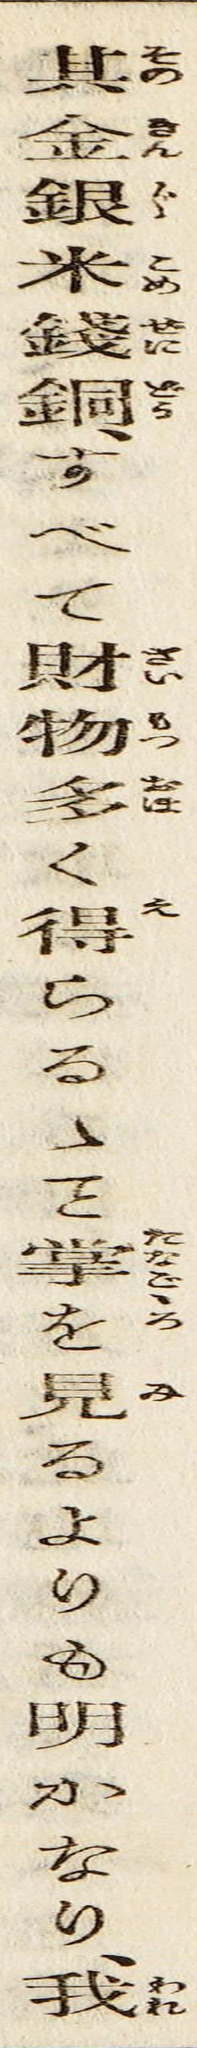其金銀米銭銅、すべて財物多く得らるゝこと掌を見るよりも明かなり、我
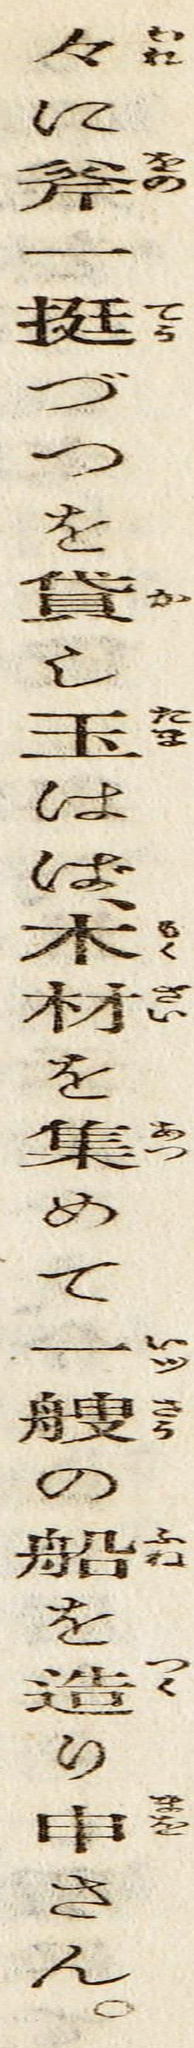々に斧一挺づつを貸し玉はば、木材を集めて一艘の船を造り申さん。
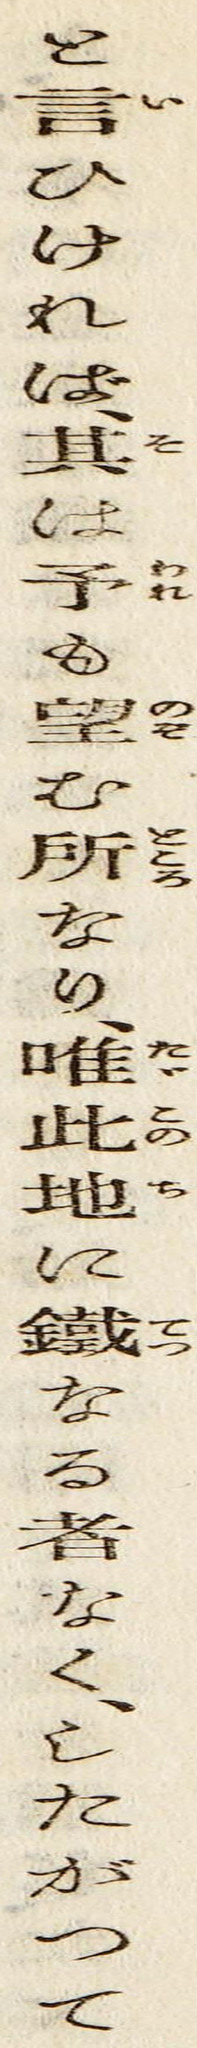と言ひければ、其は予も望む所なり、唯此地に鉄なる者なく、したがつて
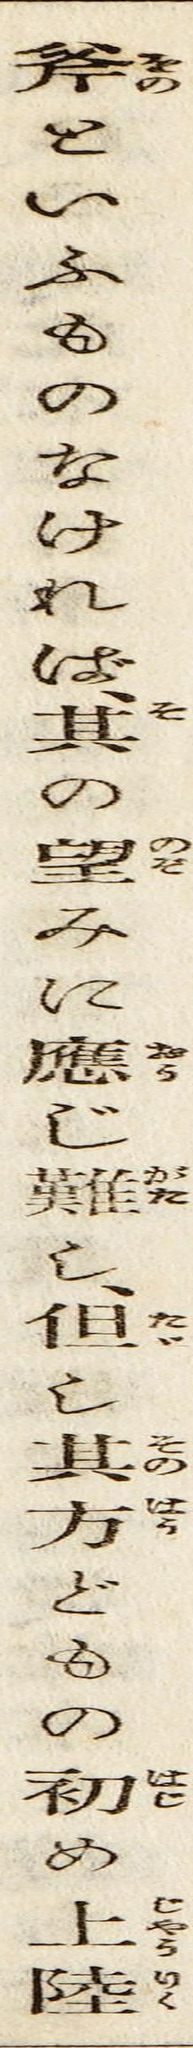斧といふものなければ、其の望みに応じ難し、但し其方どもの初め上陸
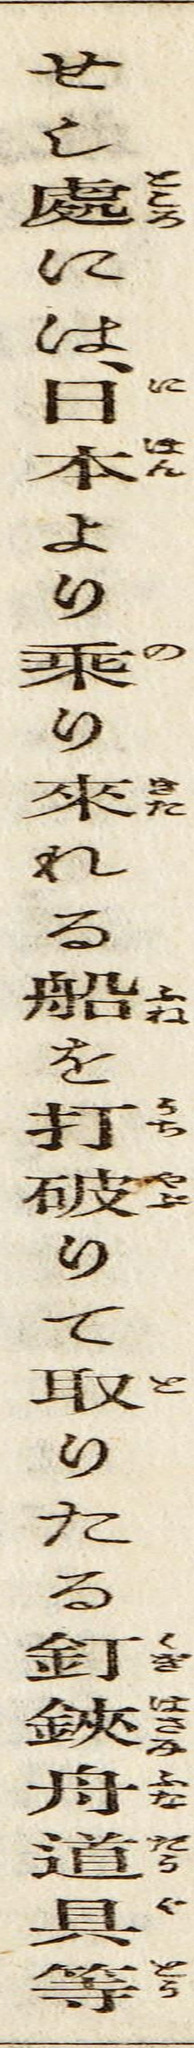せし処には、日本より乗り来れる船を打破りて取りたる釘鋏舟道具等
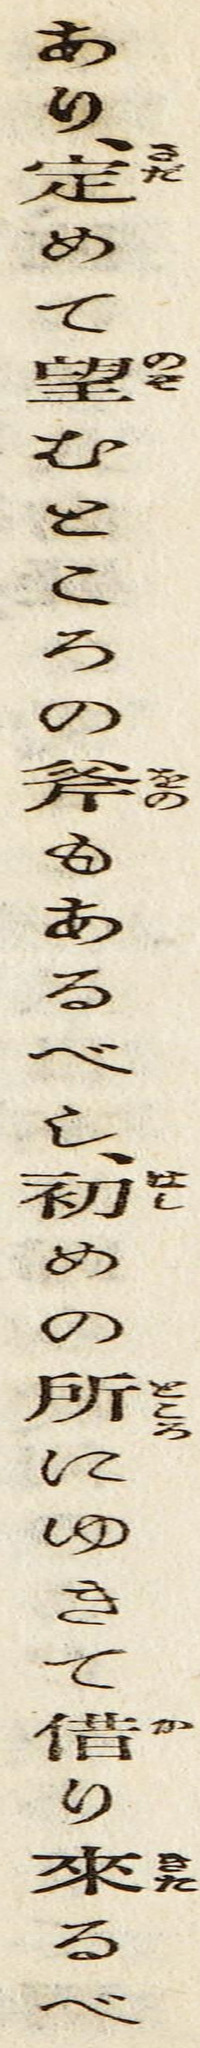あり、定めて望むところの斧もあるべし、初めの所にゆきて借り来るべ
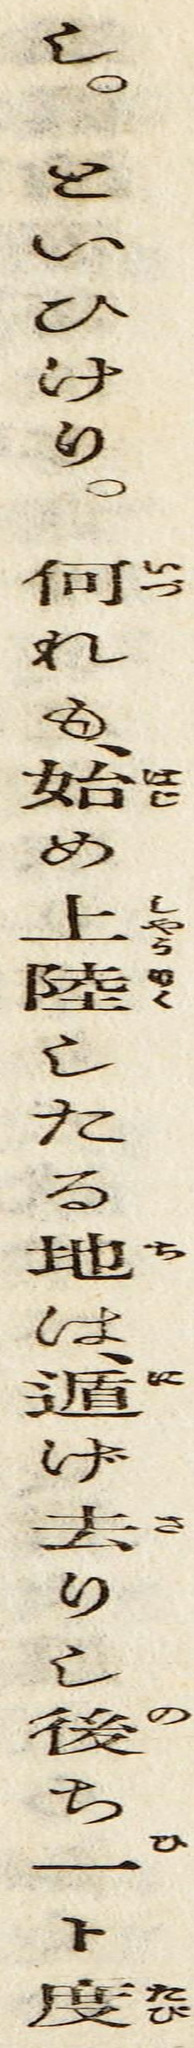し。といひけり。何れも、始め上陸したる地は、遁げ去りし後ち一ト度
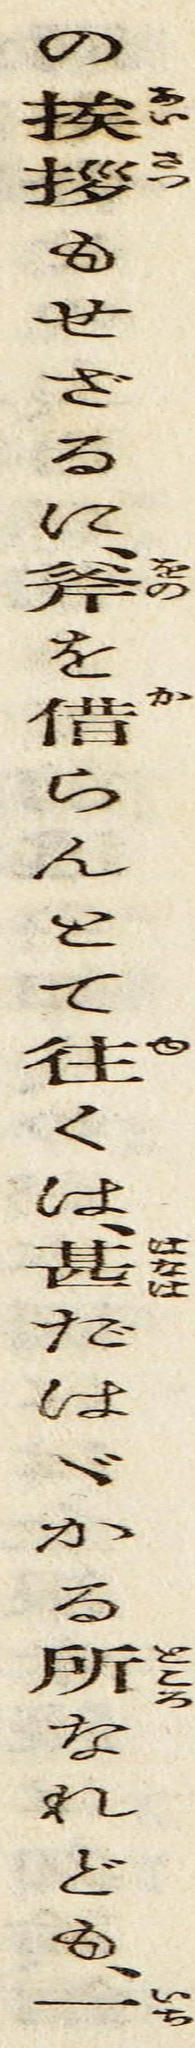の挨拶もせざるに、斧を借らんんとて往くは、甚だはヾかる所なれども、一

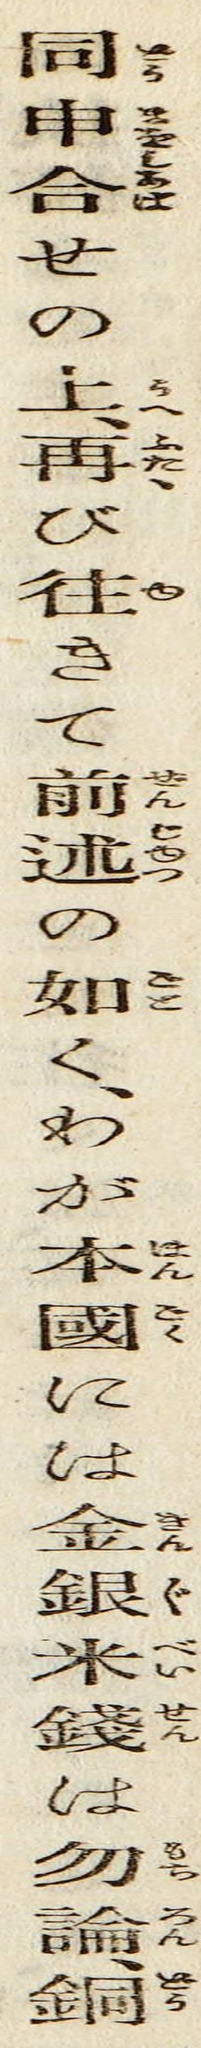同申合せの上、再び往きて前述の如く、わが本国には金銀米銭は勿論、銅
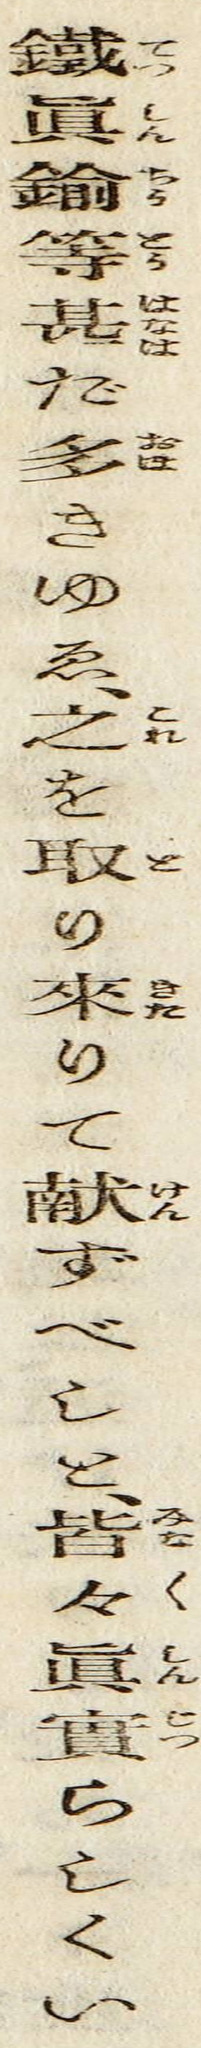鉄真鍮等甚だ多きゆゑ、之を取り来りて献ずべしと、皆々真実らしくい
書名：日本漂流譚
